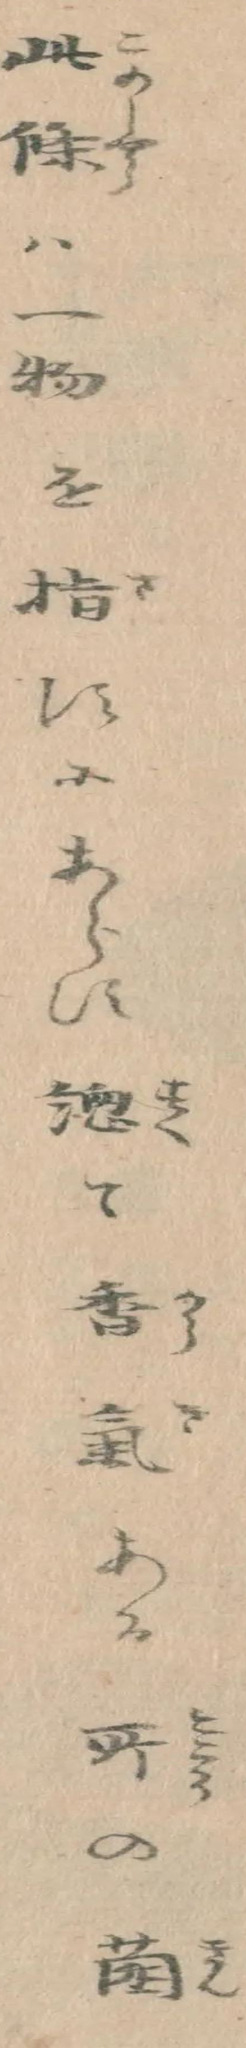此条は一物を指すにあらす総て香気ある所の菌
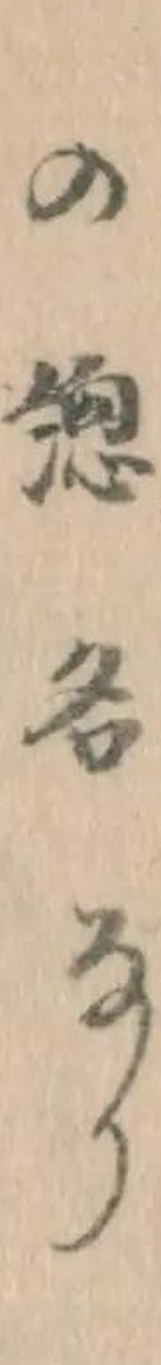の総名なり

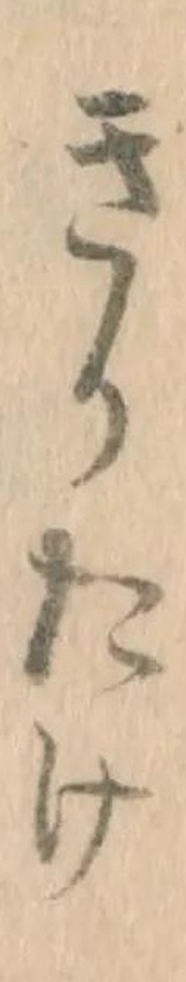きりたけ
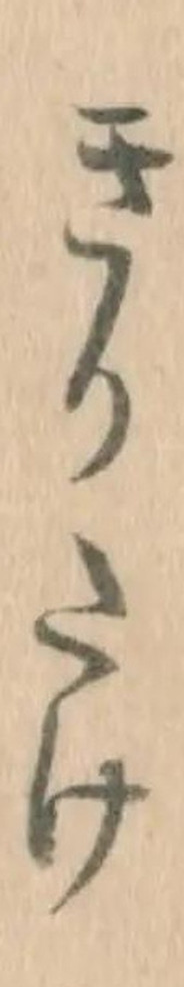きりたけ
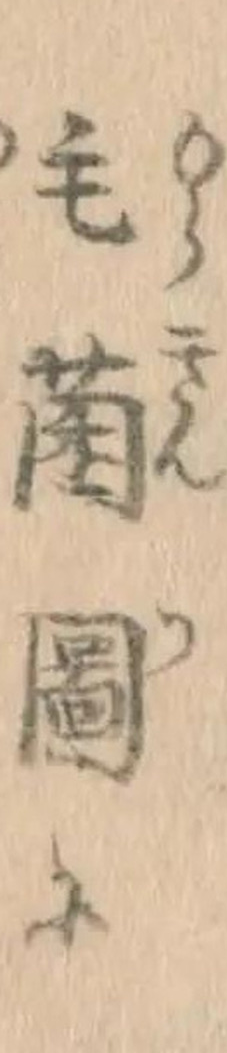毛菌図に
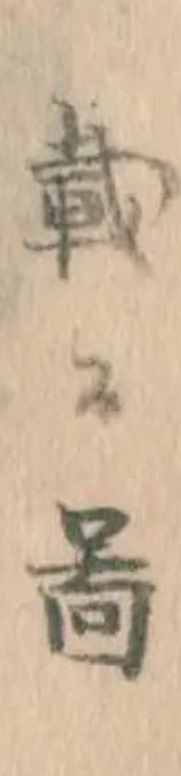載る図
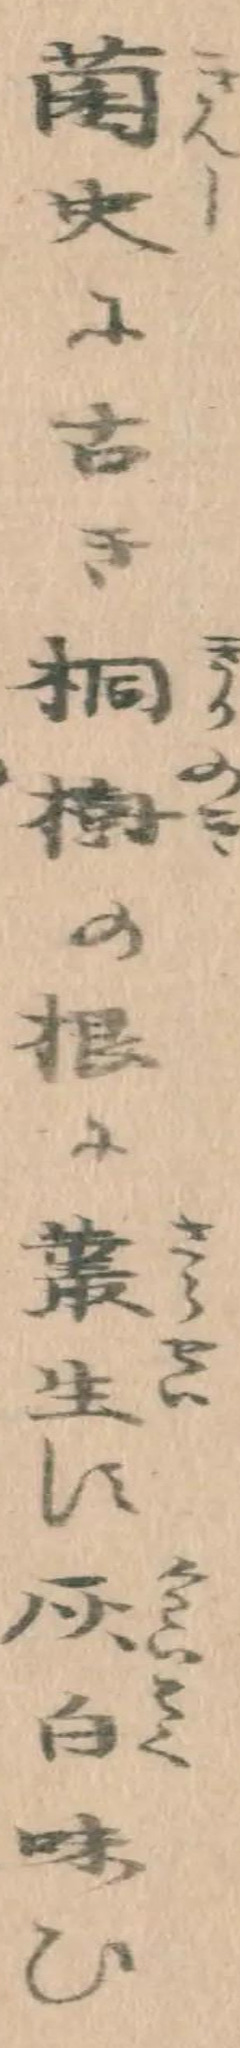菌史に古き桐樹の根に叢生す灰色味ひ
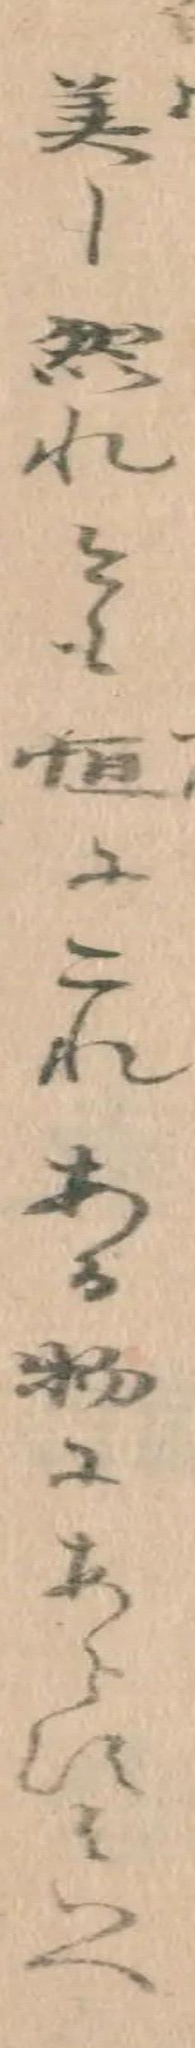美し然れとも恒にこれある物にあらすといへ
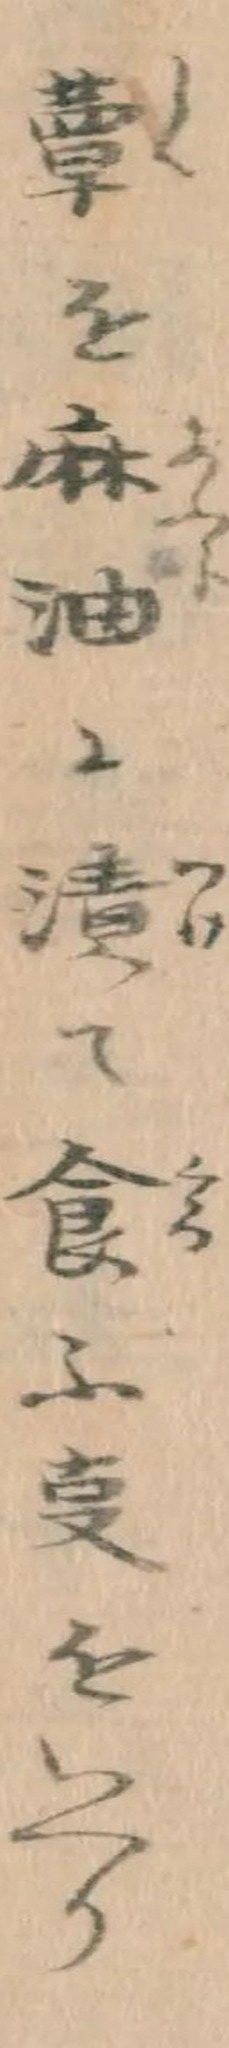蕈を麻油に漬て食ふ事をいへり
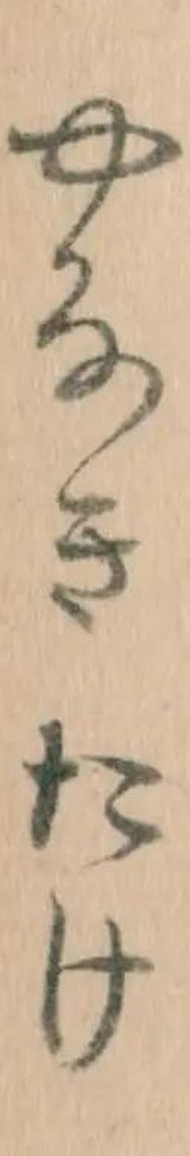やなきたけ
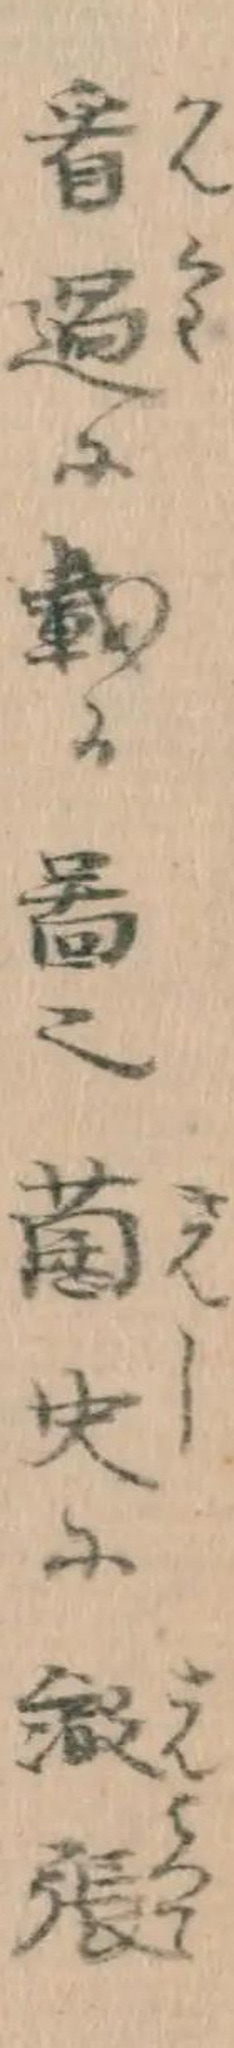看過に載る図也菌史に張
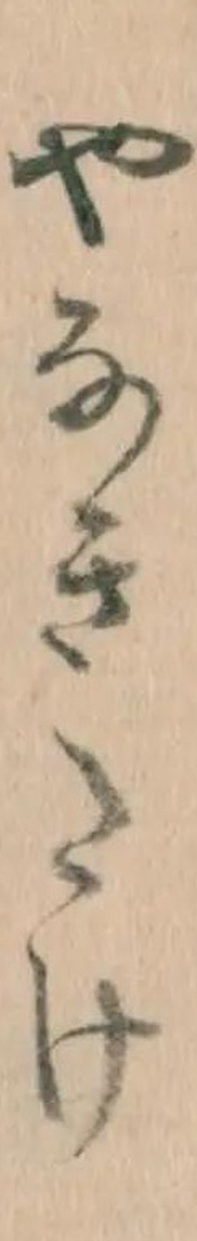やなきたけ
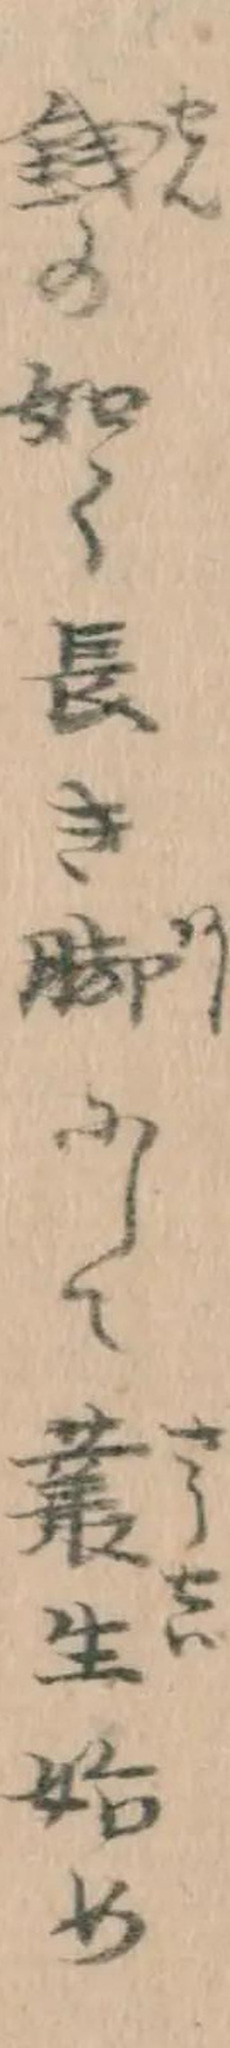銭の如く長き脚にして叢生始め
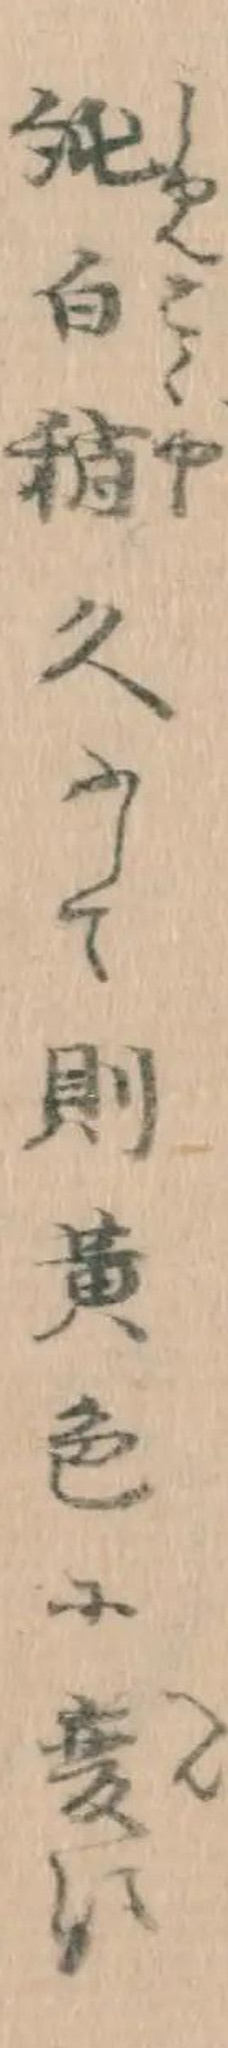純白稍久にして則黄色に変す
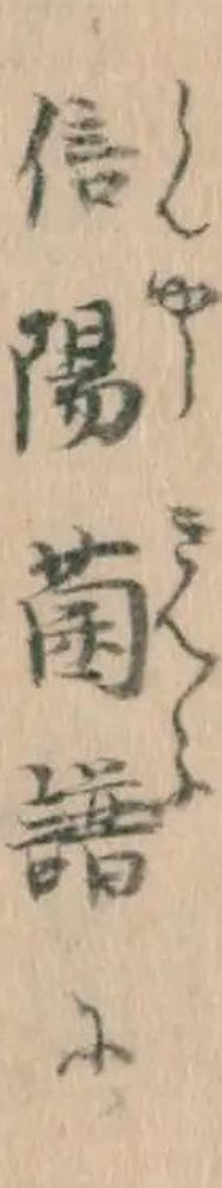信陽菌譜に
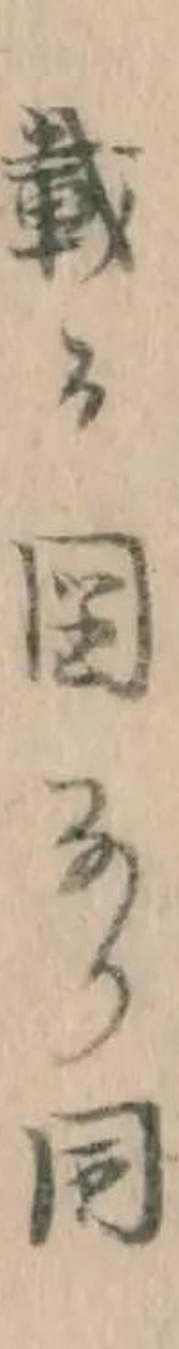載る図なり同
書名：本草図譜. 巻55-57
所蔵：国立国会図書館 National Diet Library, JAPAN
